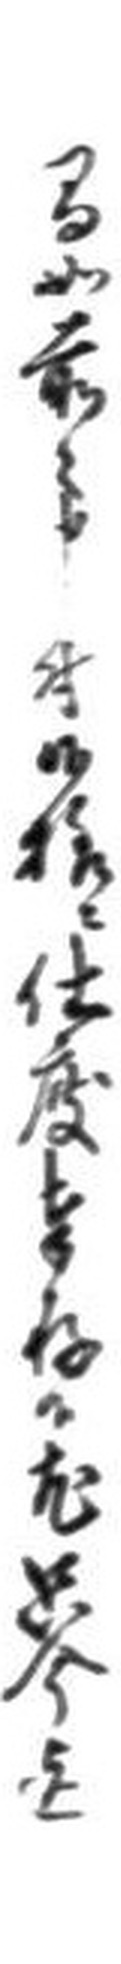間如前々申付候様ニ仕度奉存候尤只今迄
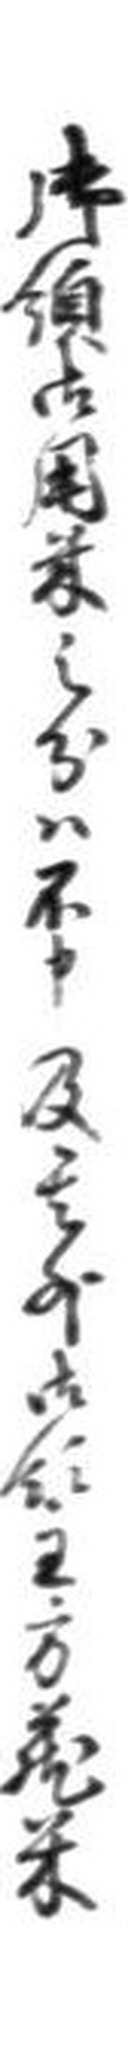御領御用米之分ハ不申及其外御領主方蔵米
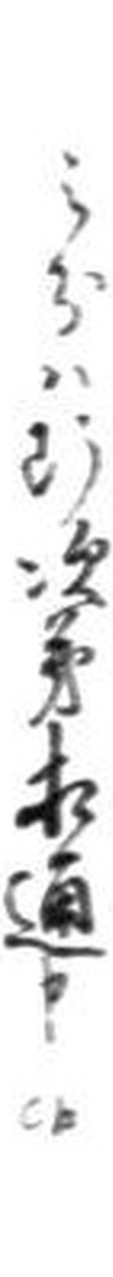之分ハ断次第相通申候

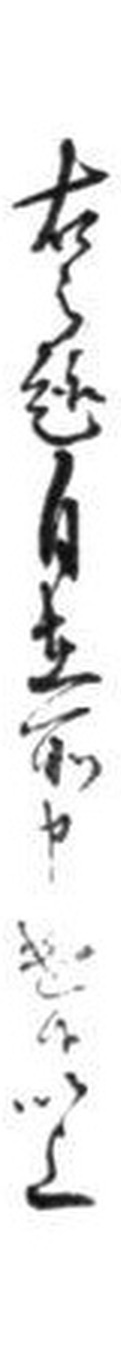右之趣自在所申遣候以上
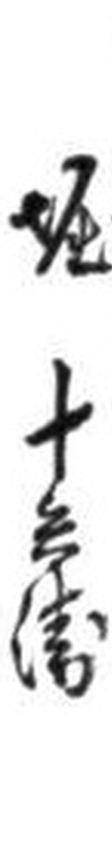堀十兵衛
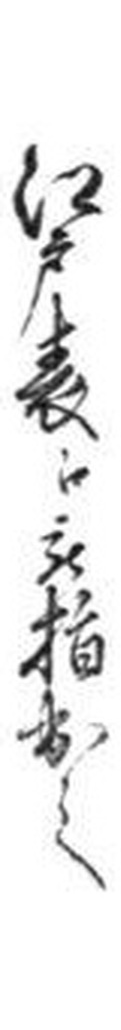江戸表江被指出之
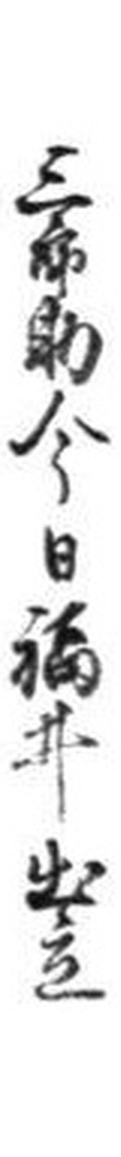三郎助今日福井出立
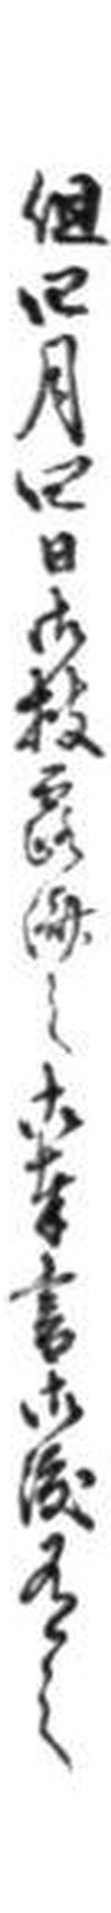但四月四日御披露済之御奉書御渡有之
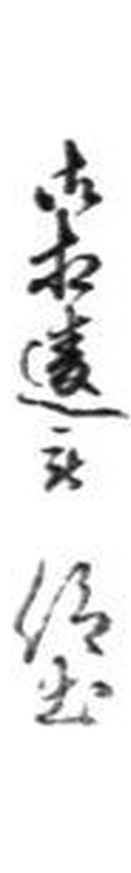御相違被仰出
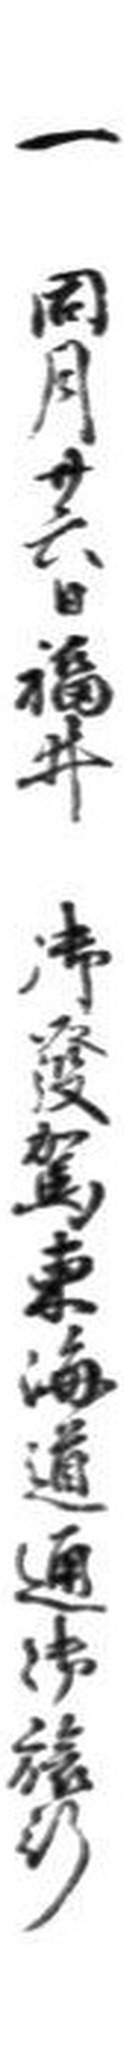一同月廿六日福井御発駕東海道通御旅行
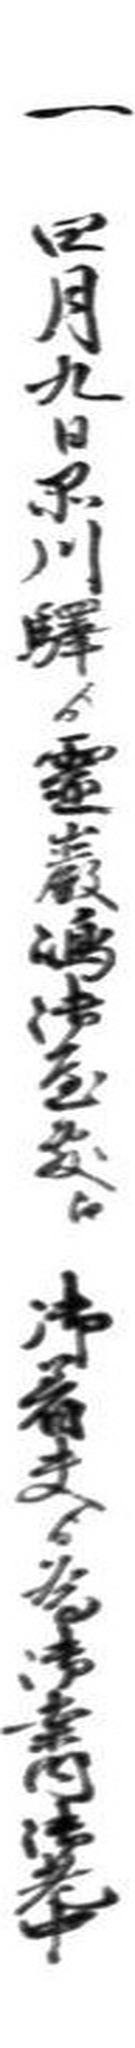一四月九日品川駅ゟ霊厳嶋御屋敷江御着夫ゟ為御案内御老中
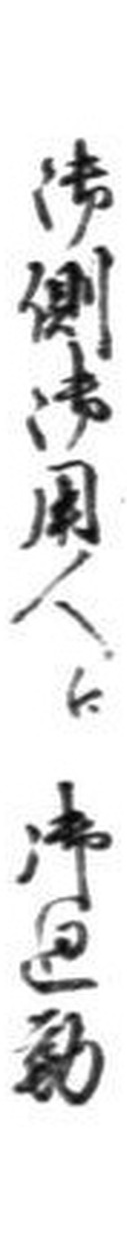御側御用人江御廻勤
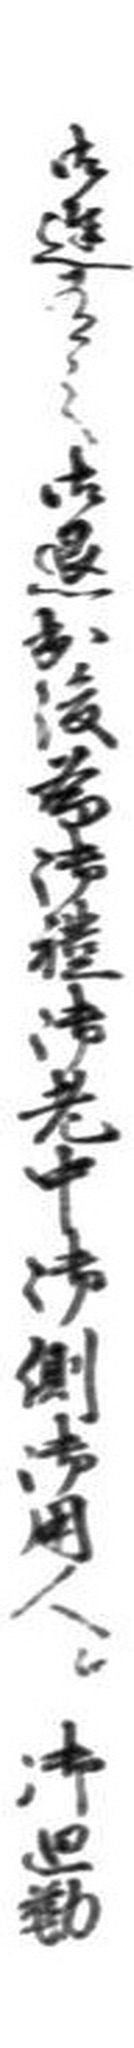御達有之御退出後為御礼御老中御側御用人江御廻勤
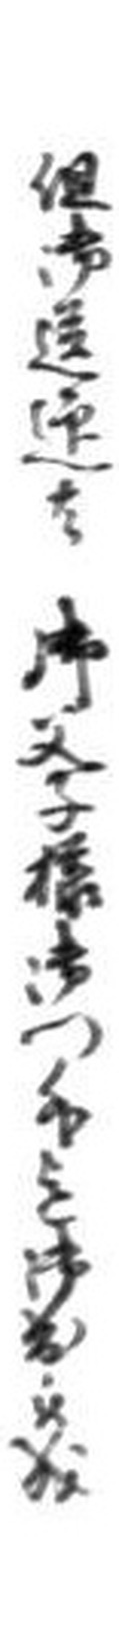但御送迎共御父子様御門外迄御出被成
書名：家譜 二十二 吉品公 従元禄十五年到同十六年
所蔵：福井県文書館 Fukui Prefectural Archives
